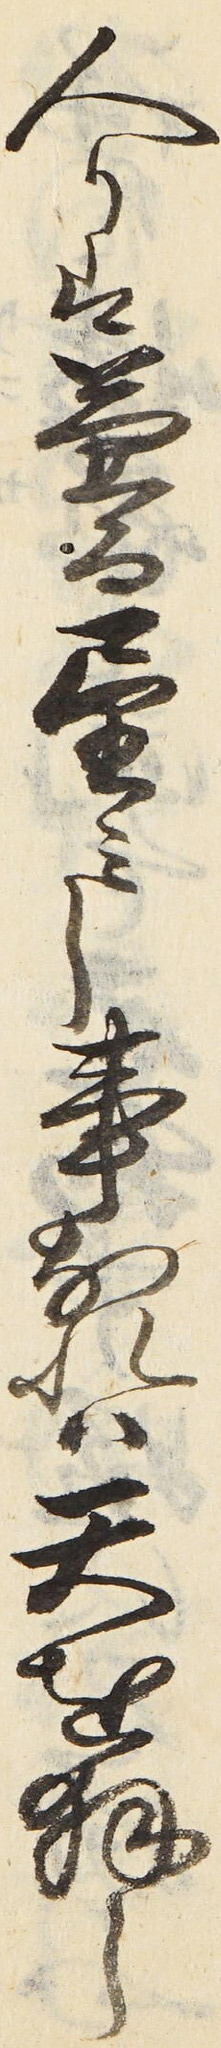人りは兼而望みし事なれは天を拝し
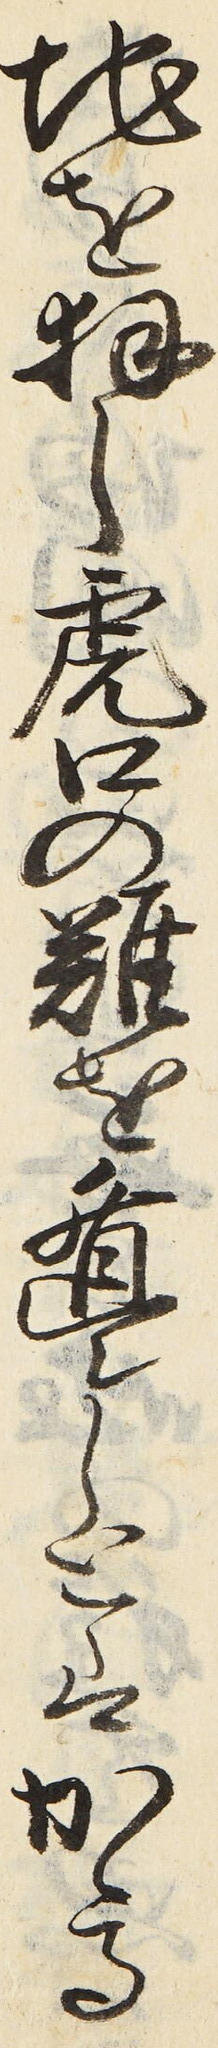地を拝し虎口の難を遁れしとはかゝる
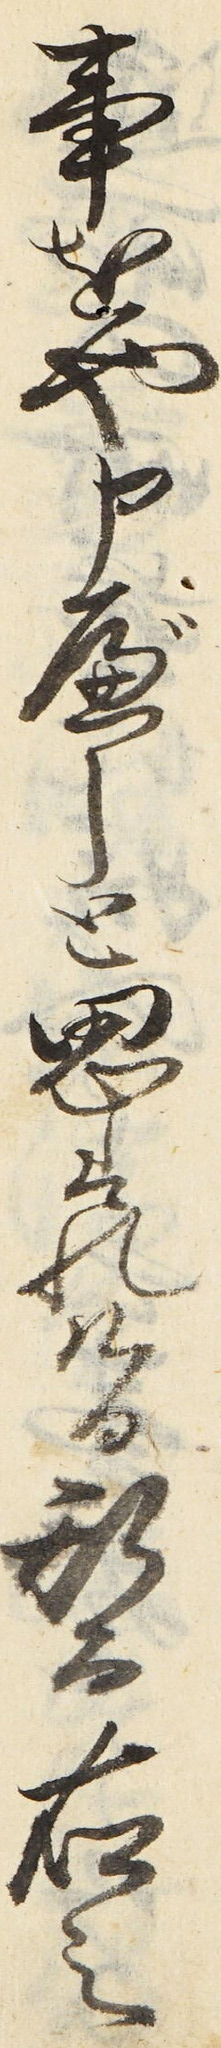事をや申べしと思はれける斯而右之
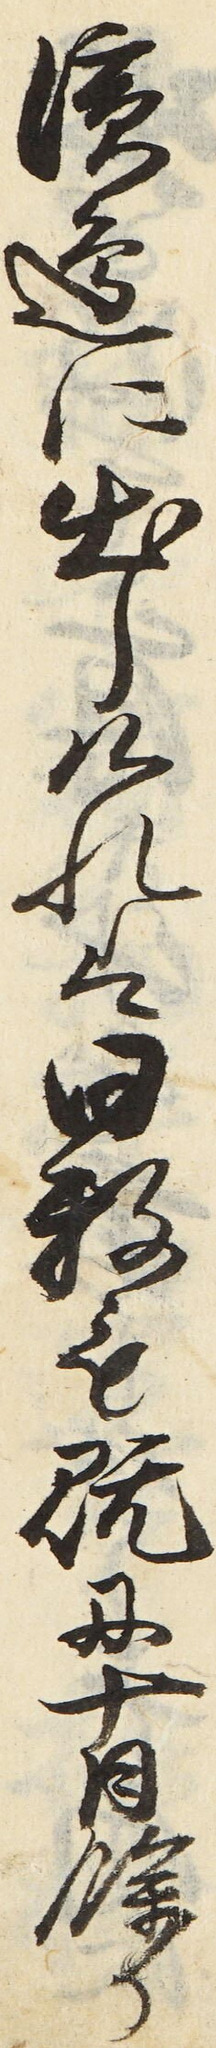浜辺に出しけれは日数も既に十日余り
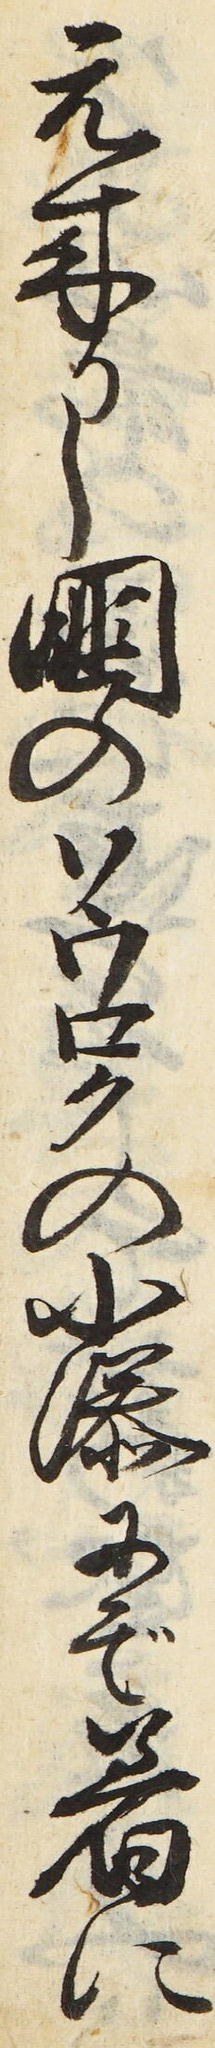元来りし国のソウロクの小湊にぞ着に

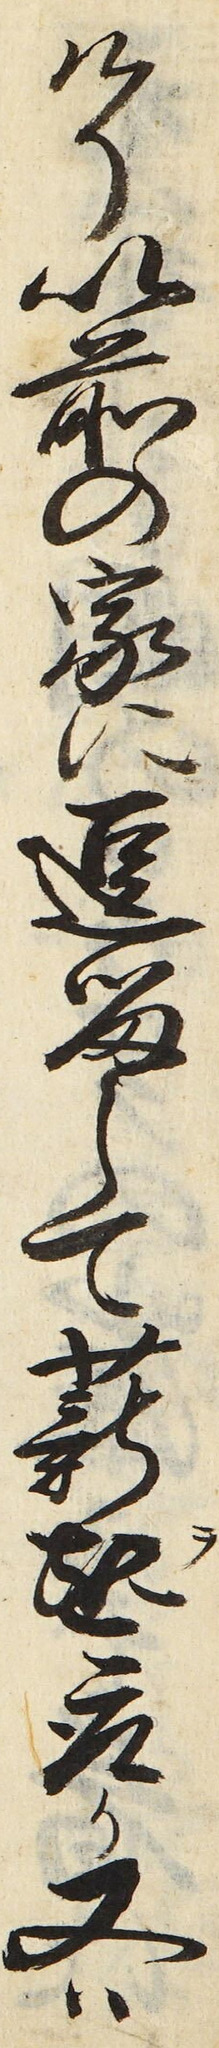けり以前の家に逗留して薪を取り又は
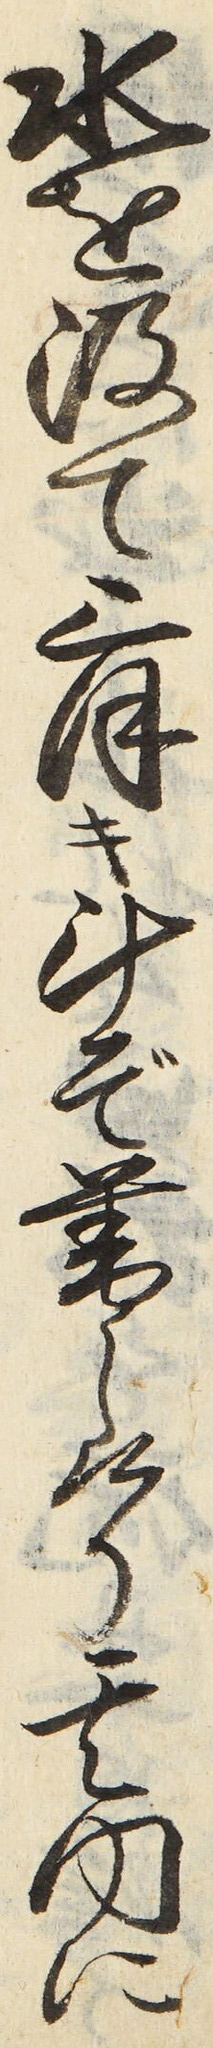水を汲て三月き計ぞ暮しけり其内に
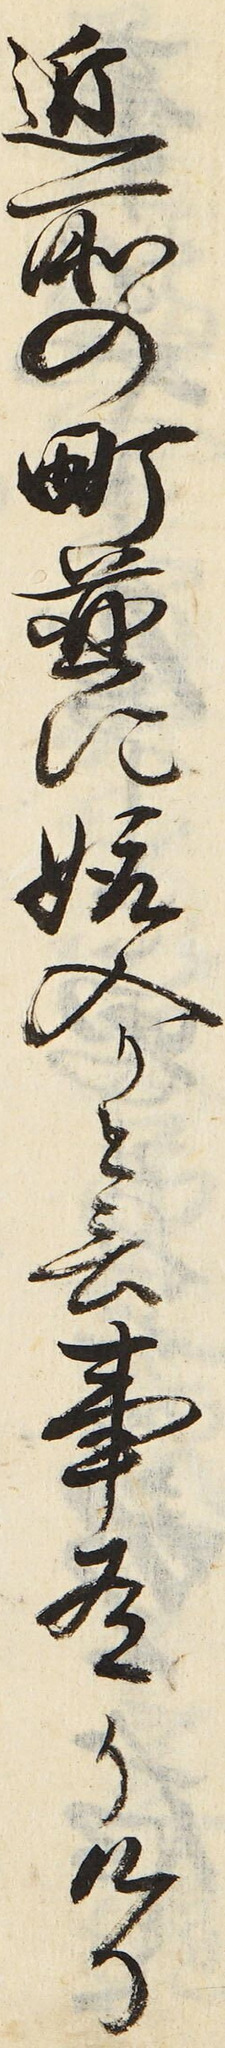近所の町並に娵入りと云事有りけり
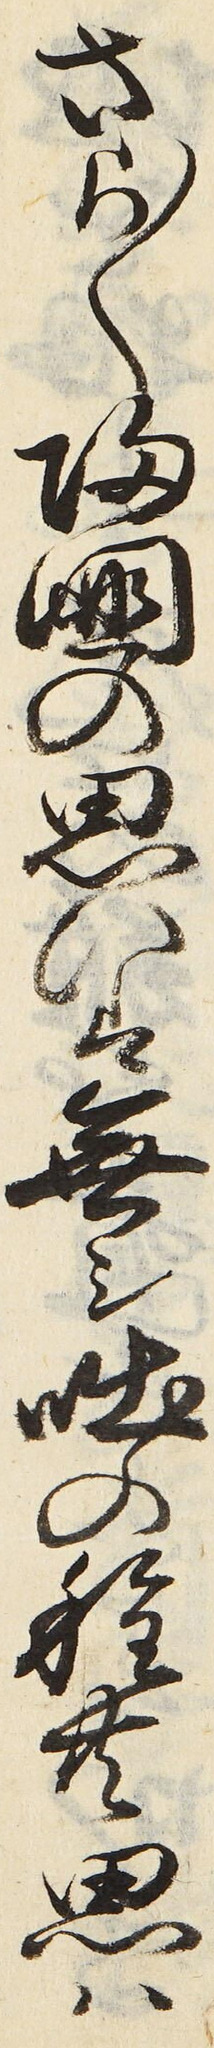さら〳〵帰国の思ひは無し咄の種共思は
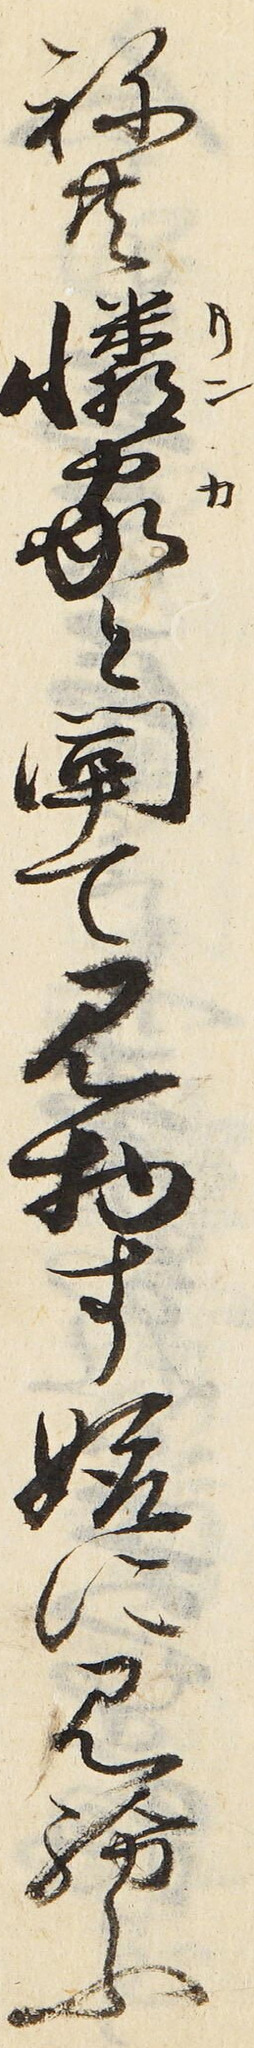ね共隣家と聞て見物す娵に見紛ふ
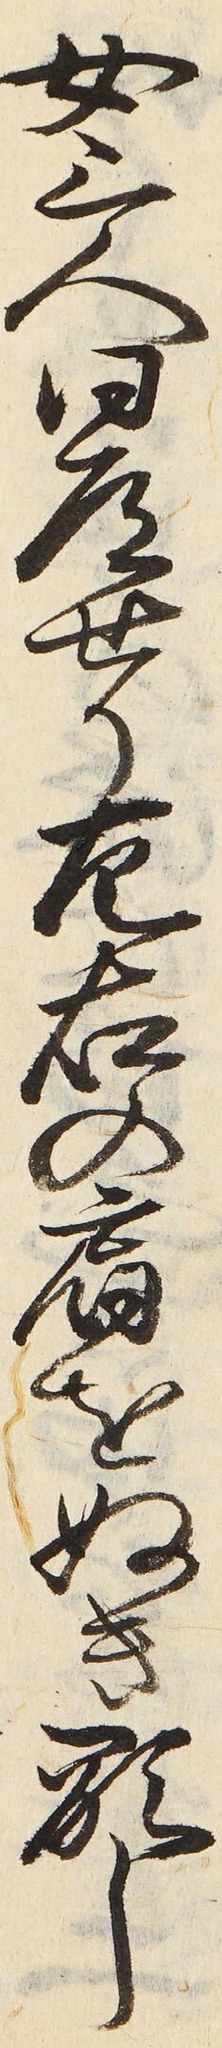女三人同道せり左右の肩をぬき顕し
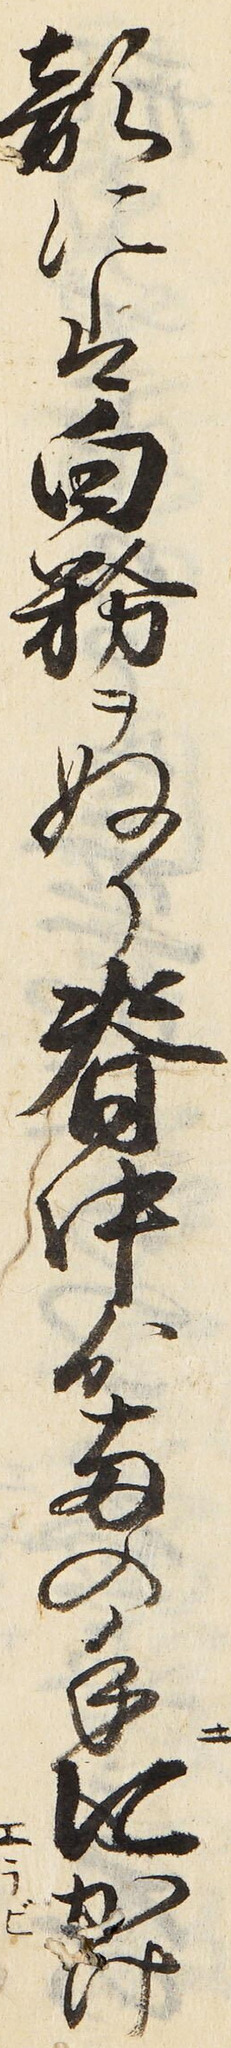顔には白粉をぬり背中ゟ両の手にかけ
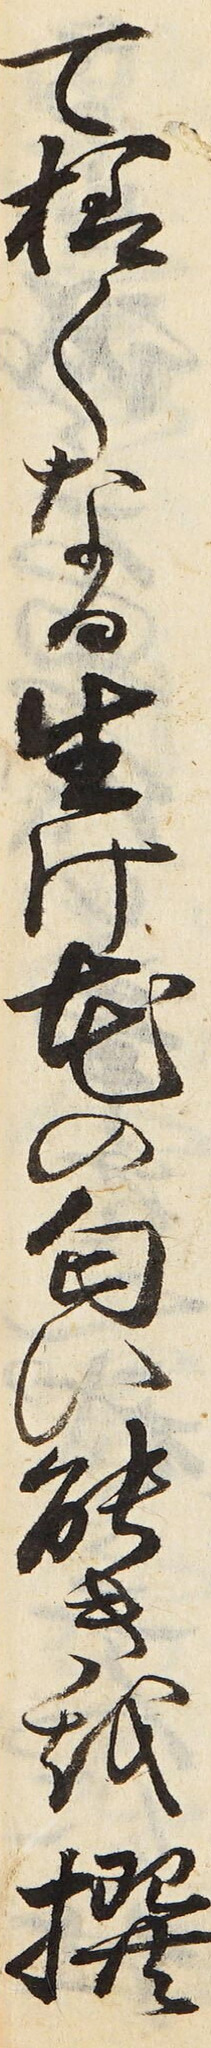て様々なる生け花の匂ひ能きを撰
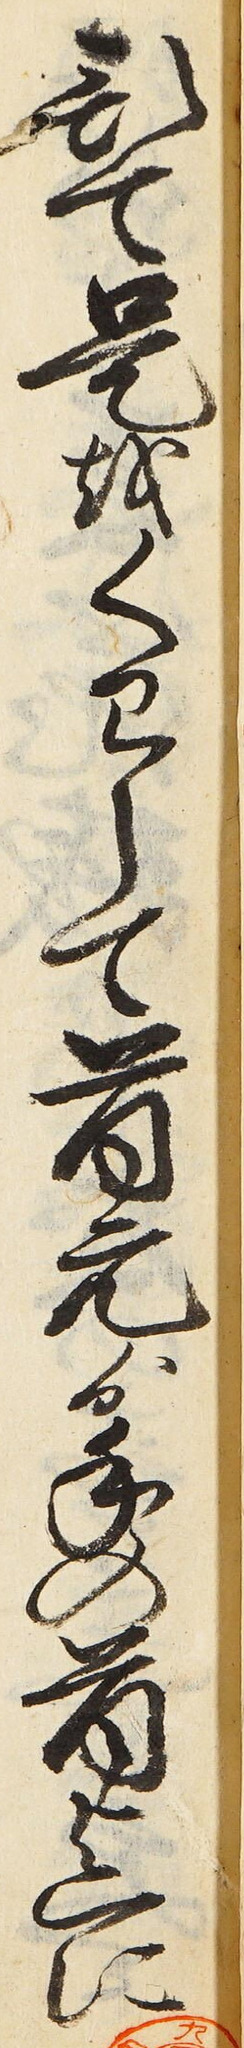ひて是をくわして首元ゟ手の首迠に
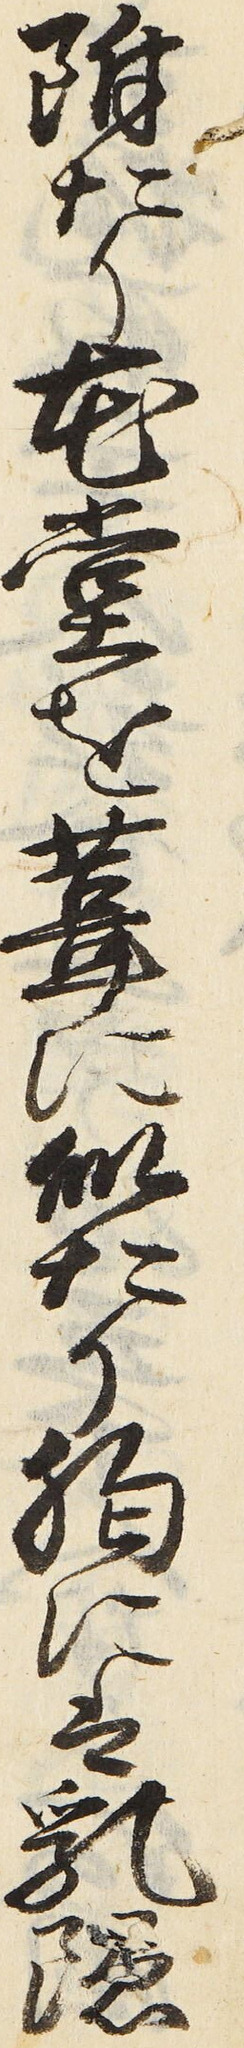附たり花堂を葺に似たり胸には乳隠
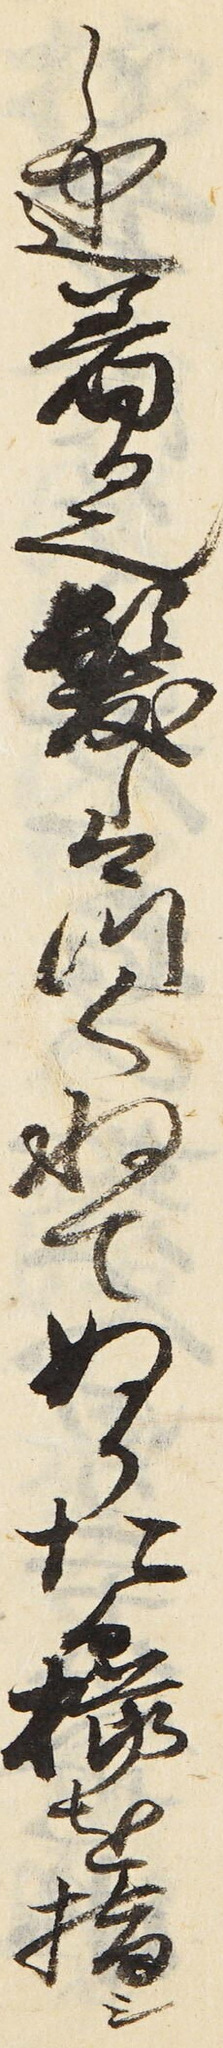し迚着る也髪はつくねてぬりたる櫛を指し
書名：華夷九年録
